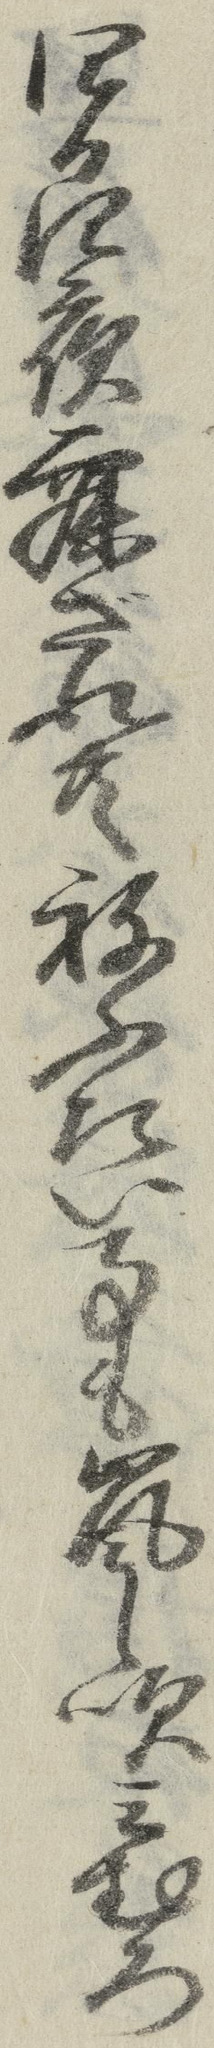四日四夜寝ざれ共ねふたい事も嵐し吹みむろ
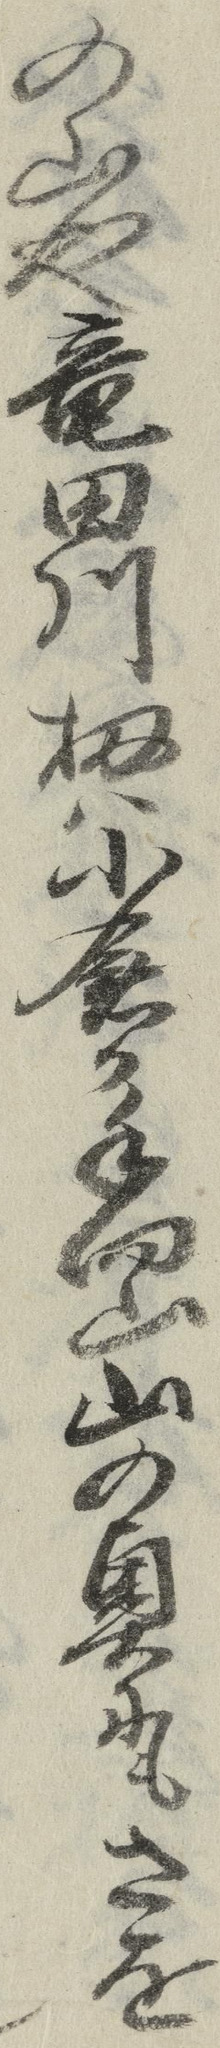の山や竜田川扨は小倉か手向山の奥にもさを
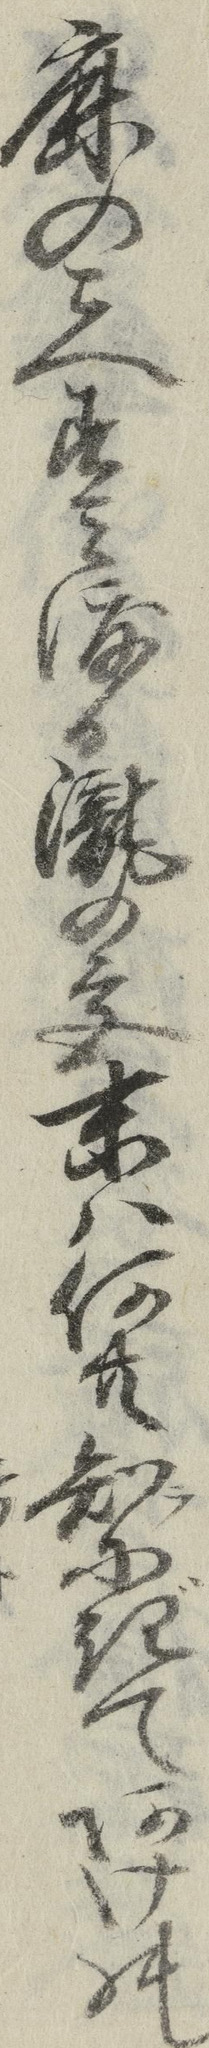鹿のこへすみ渡る瀧の宮末は何共知
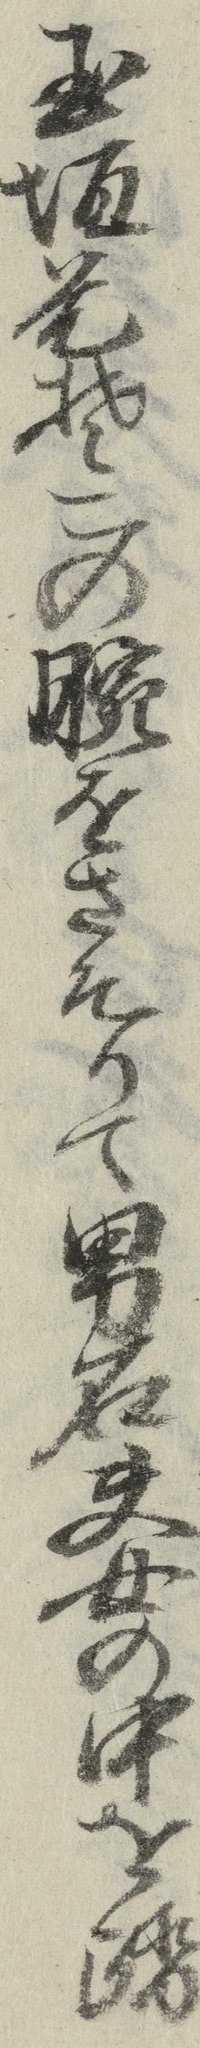玉垣是そこの腕をさそりて男石夫女の中を踏
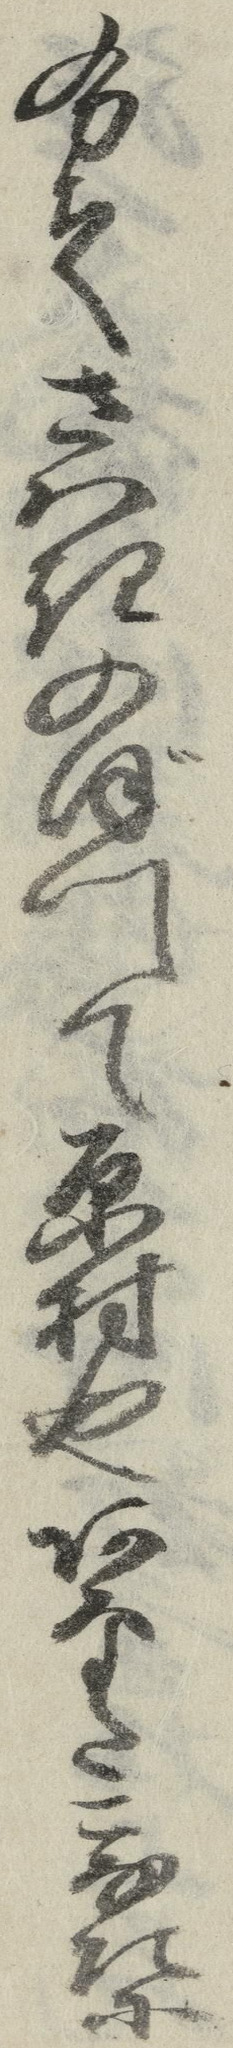分てさはきのぼつて原村やあなたこなたに
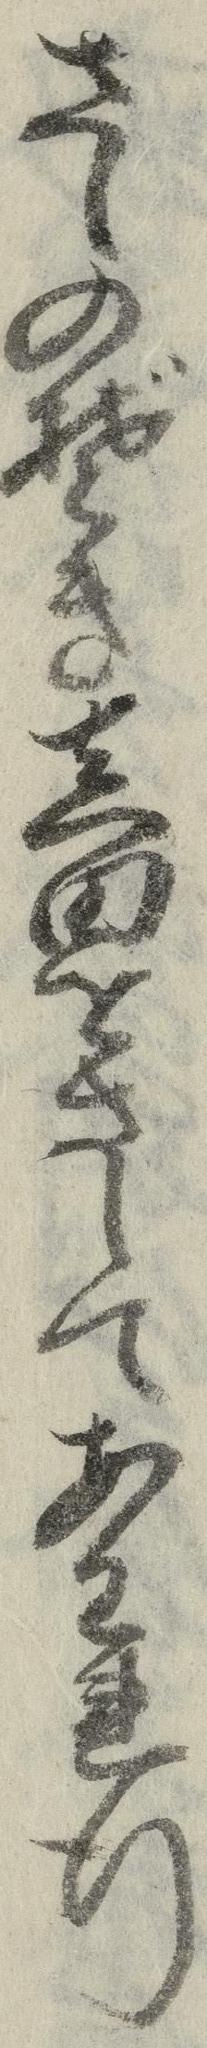さしのぞき真田をさしてあわれ行

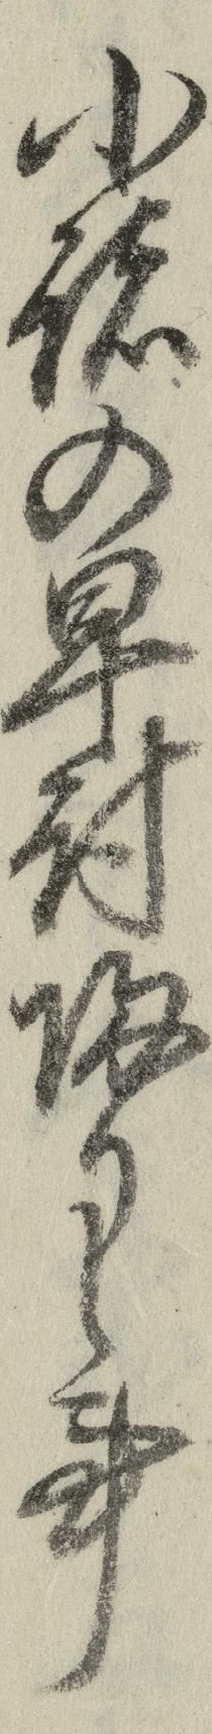小諸の早討帰りし事
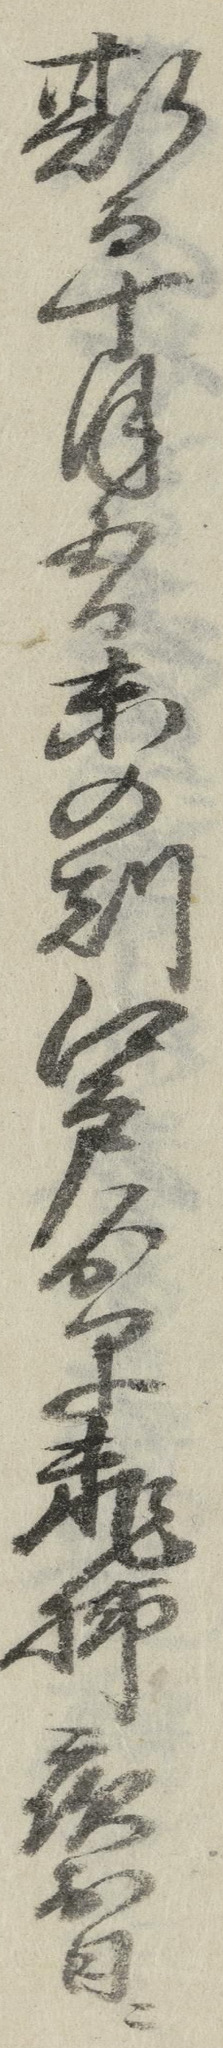斯る十月五日未の刻江戸ゟ早飛脚夜お日に
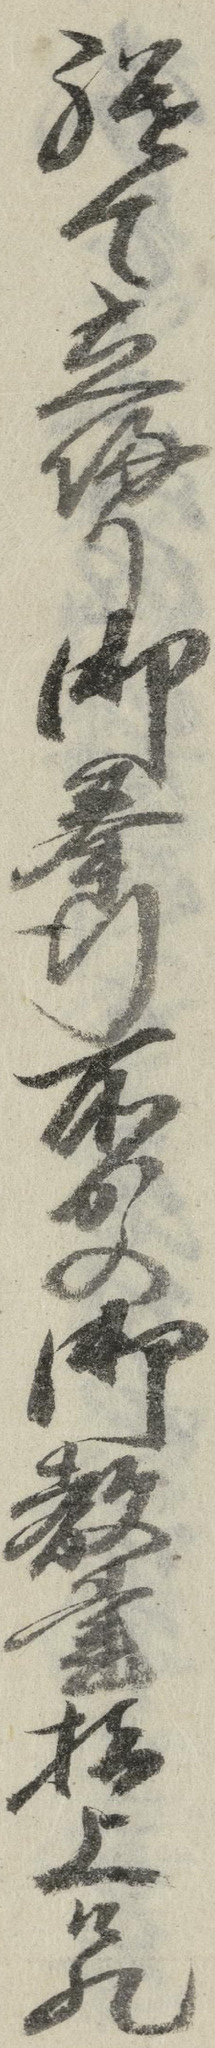継て立帰り御奉行所ゟの御教書指上けれ
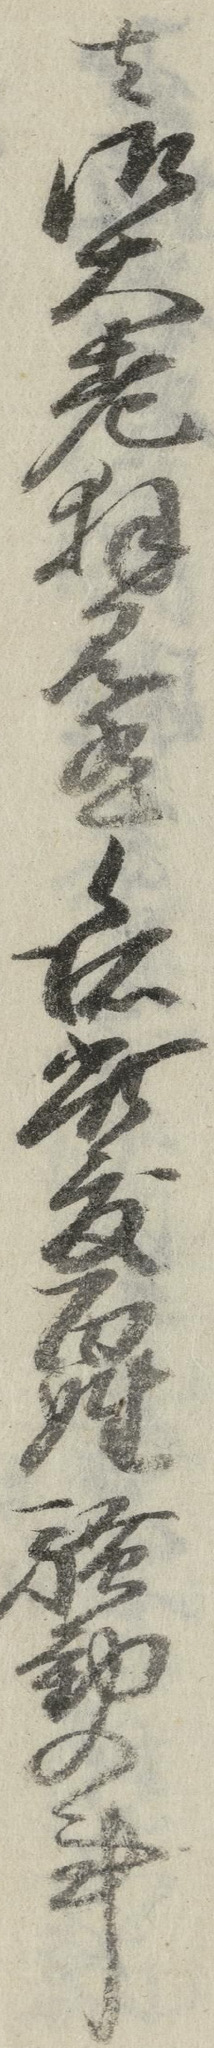は御大老拝見有し所此度百姓騒動の事
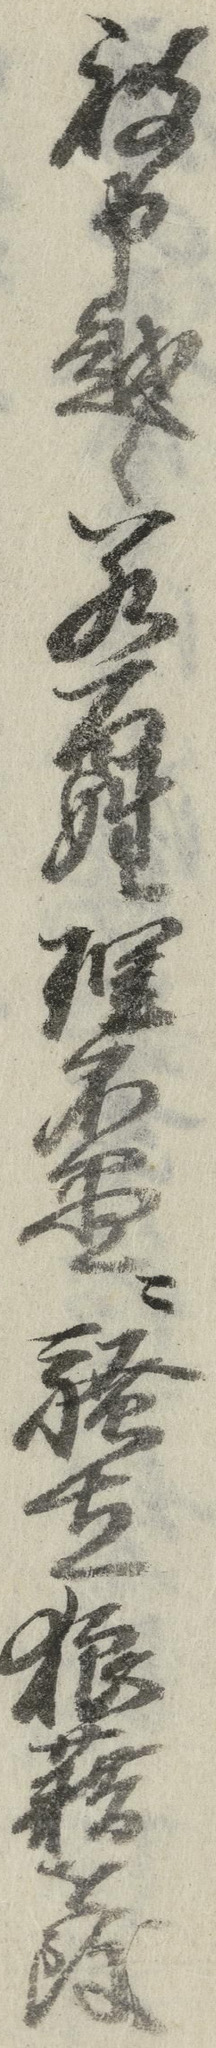被申越候若百姓理不盡に騒立狼藉を致
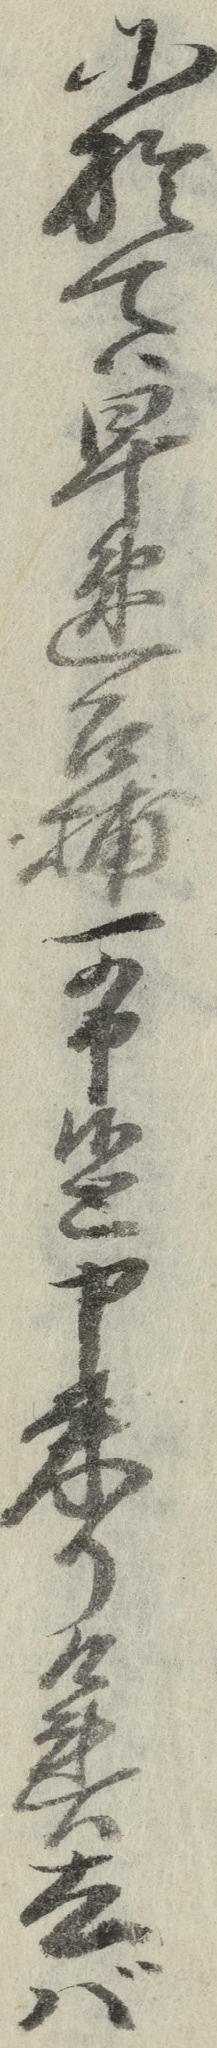に於ては早速召捕可申候と申来りけれは去ば
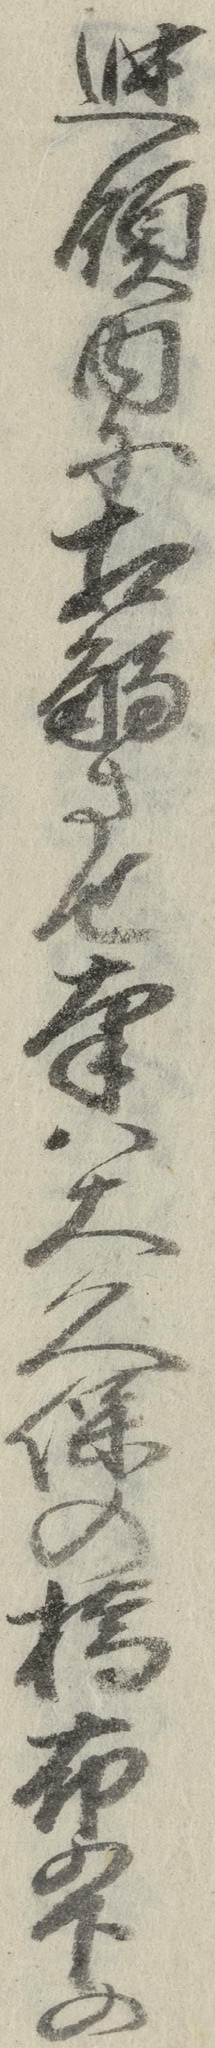迚領内に相觸させ奉は大久保の橋布の下の
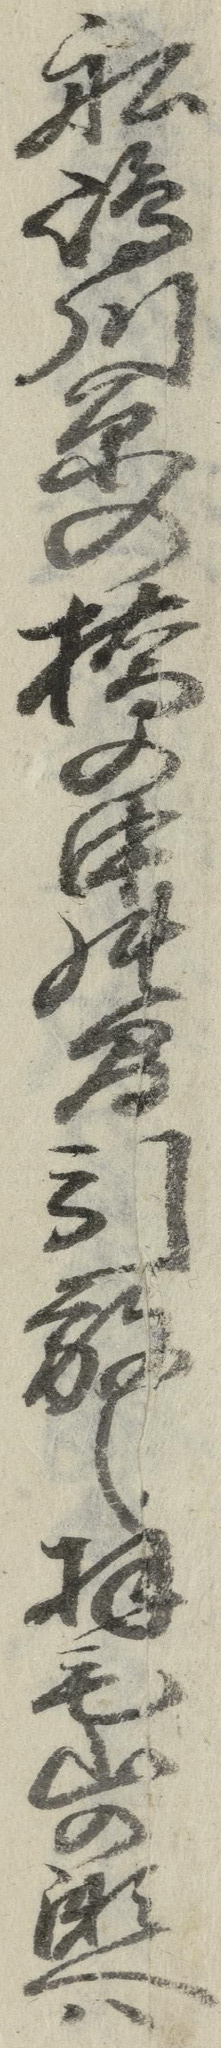舩嶋川原の橋の中の間引放し拝毛山の瀬へは
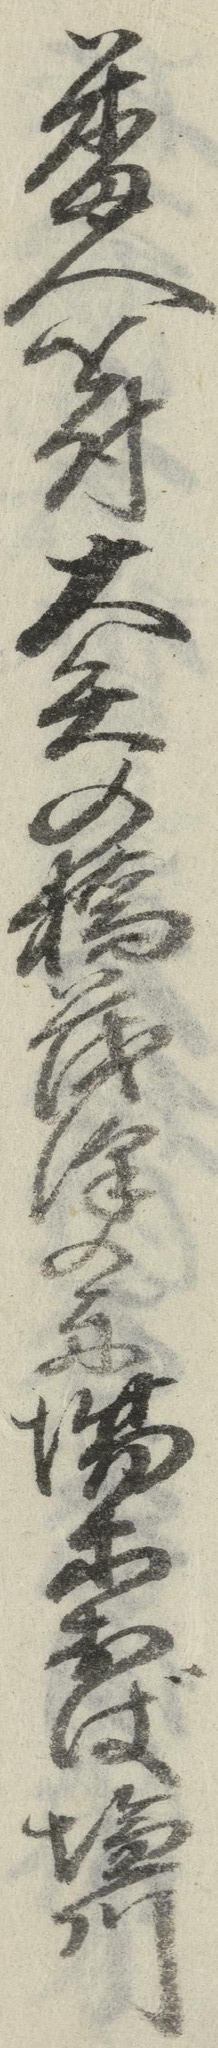番人を付大矢の橋も沢の舟場等おば塩川
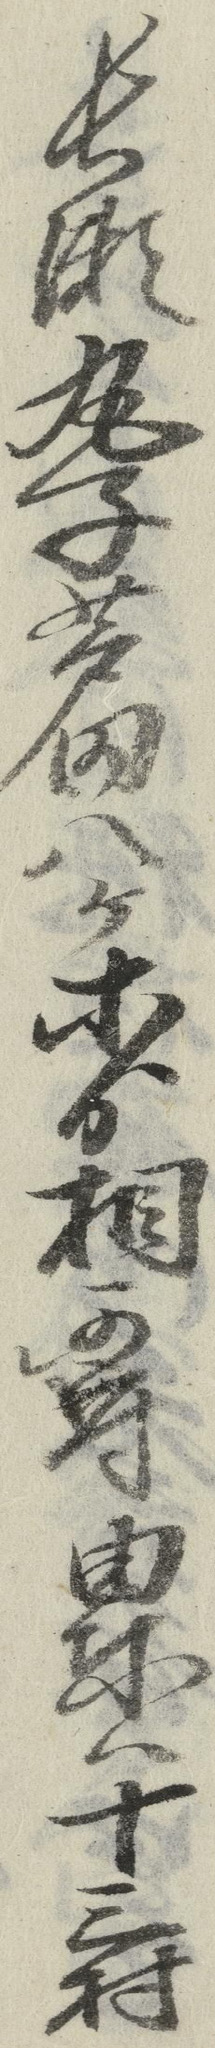長瀬丸子芦田八ケ等ゟ相可守由東は十三村
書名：浅間大焼騒動記　下
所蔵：東京大学地震研究所図書室 Earthquake Research Institute Library, The University of Tokyo, JAPAN
